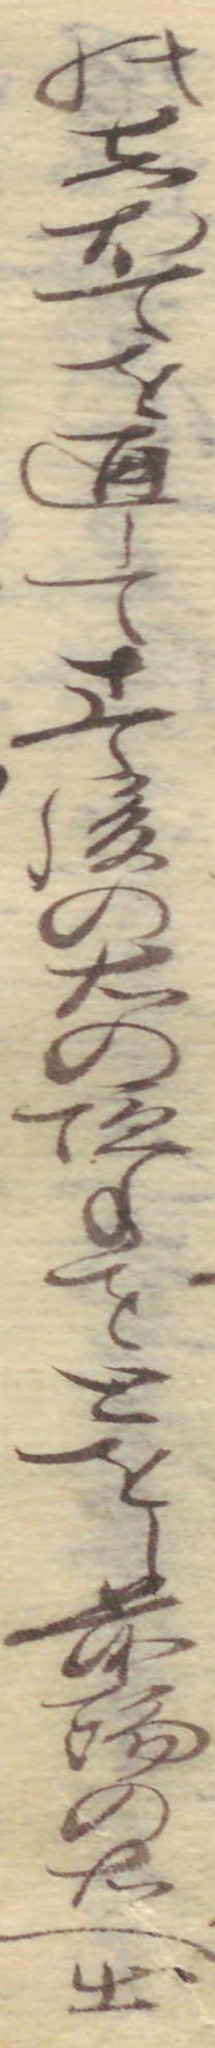のしほてを通してさて後ろの右の塩手をとをし前輪の右へ出
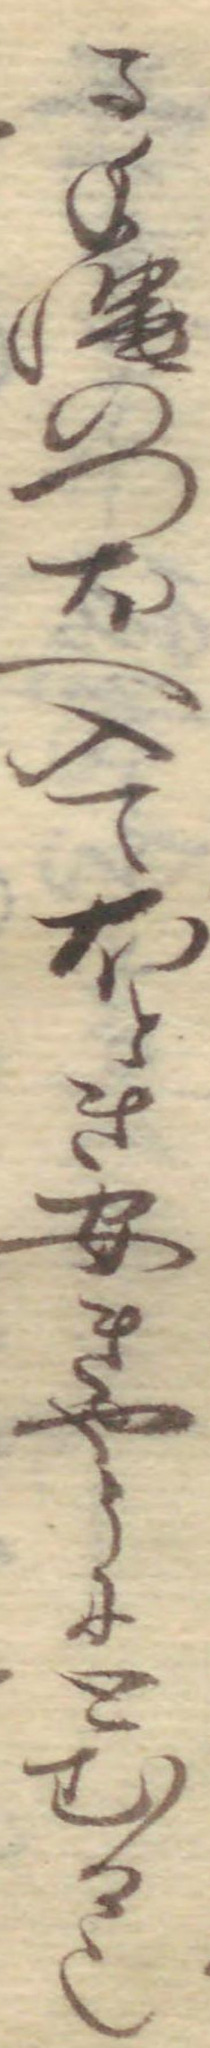る手縄のつほへ入てほとき安きやうにとむる也
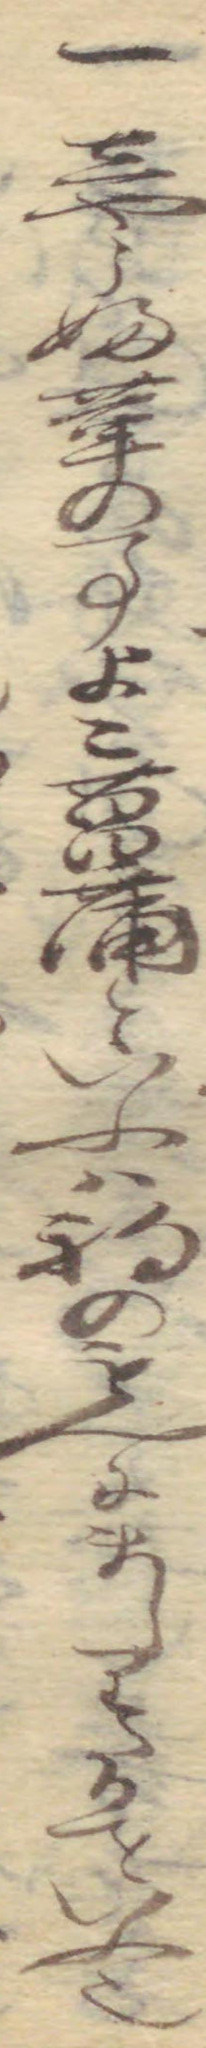一しやうふ革の事よこ菖蒲といふハ駒のもんにましりたるをいふ也
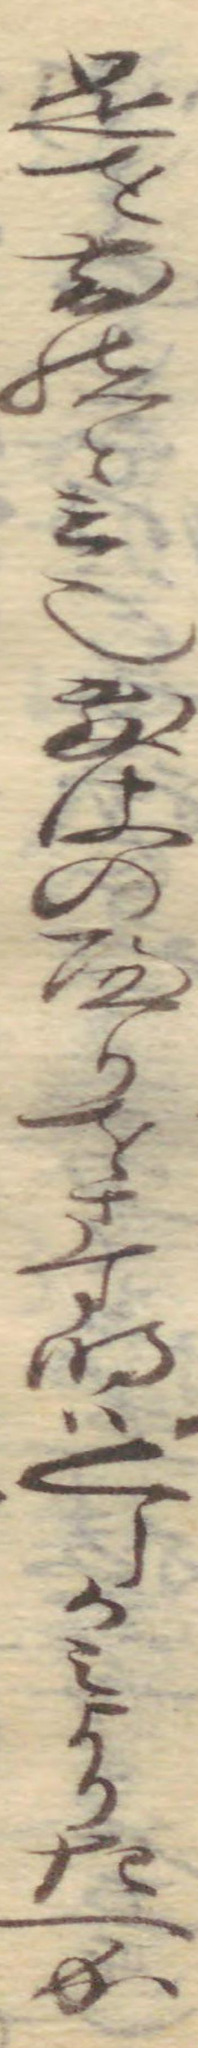是を前緒と云也敷皮のへりをさす時ハくしかミより左へ成
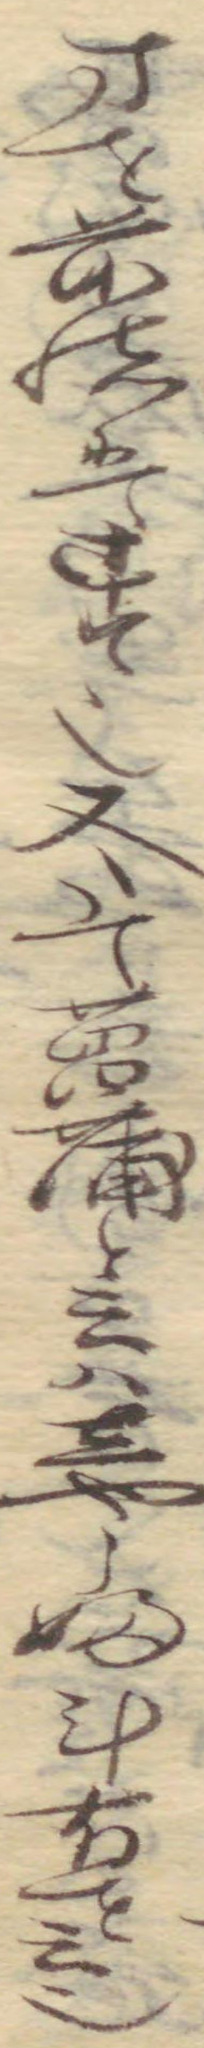方を前緒にてさす也又たて菖蒲と云ハしやうふ斗有を云也
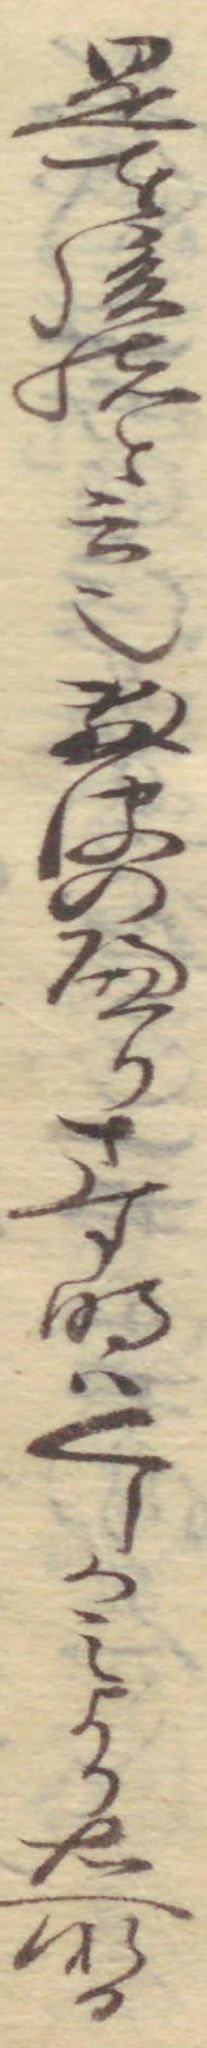是を後緒と云也敷皮のへりをさす時ハくしかミより右へなる
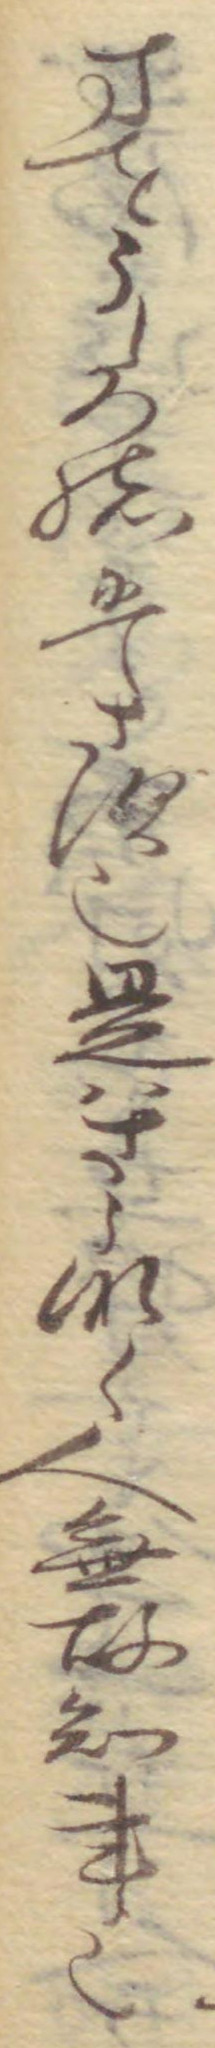方をうしろ緒にてさす也是ハさうなく人無故知事也
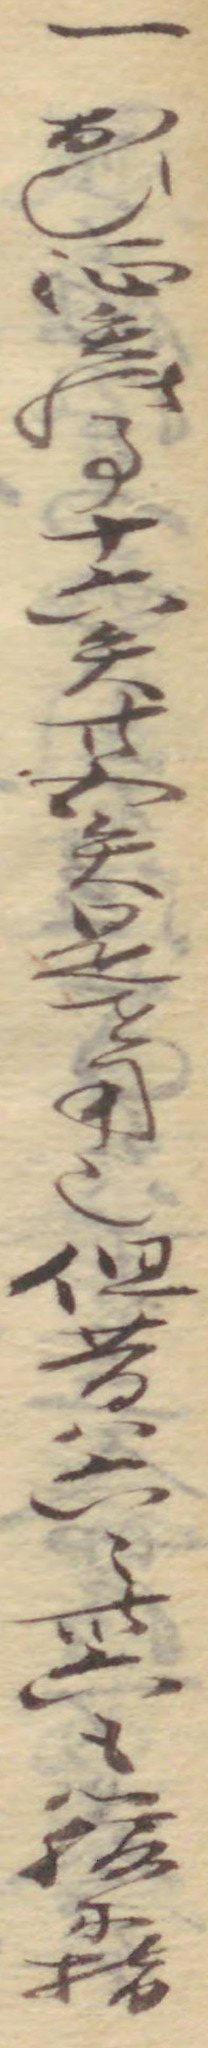一おひ征矢の事十六矢廿五矢是を用也但昔ハ六々丗六も箙に指
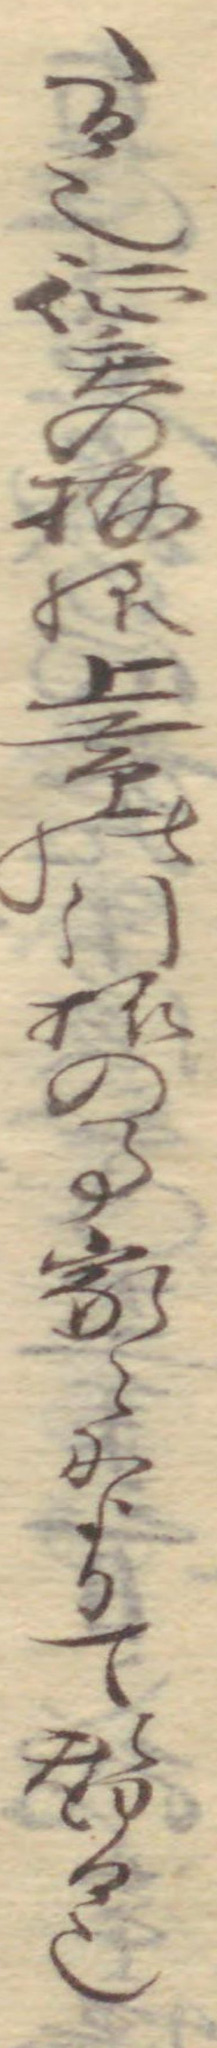たる也征矢の拵様上帯の引様の事家々によりて替る也
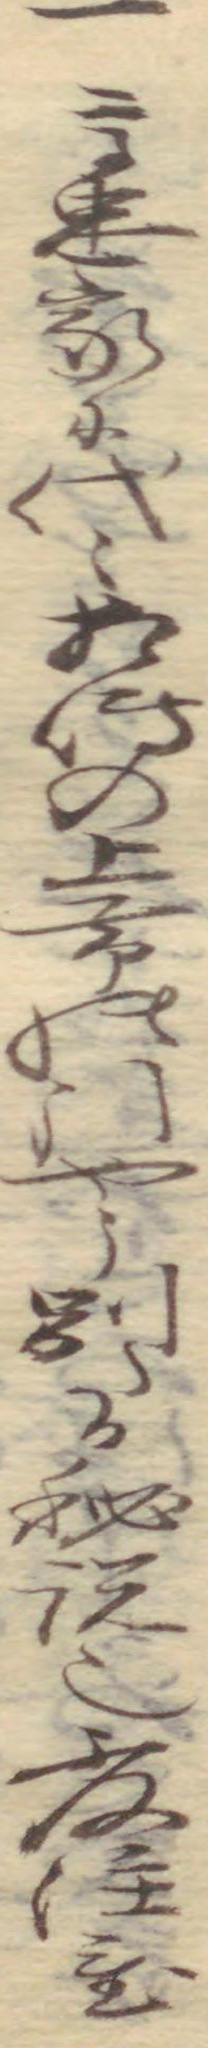一高忠家に代々相伝の上帯の引やう別たる秘説也不及注置
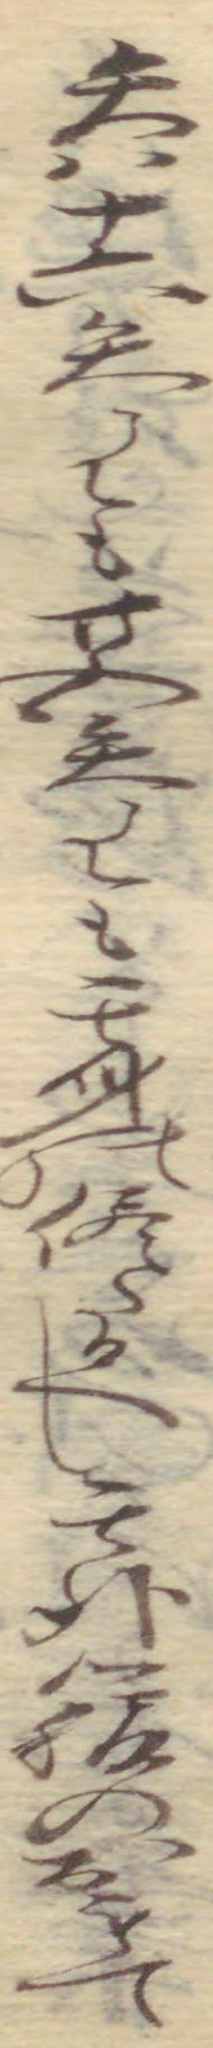矢ハ十六矢ニても廿五矢にニても其身の儘たるへし其外箙のおもて
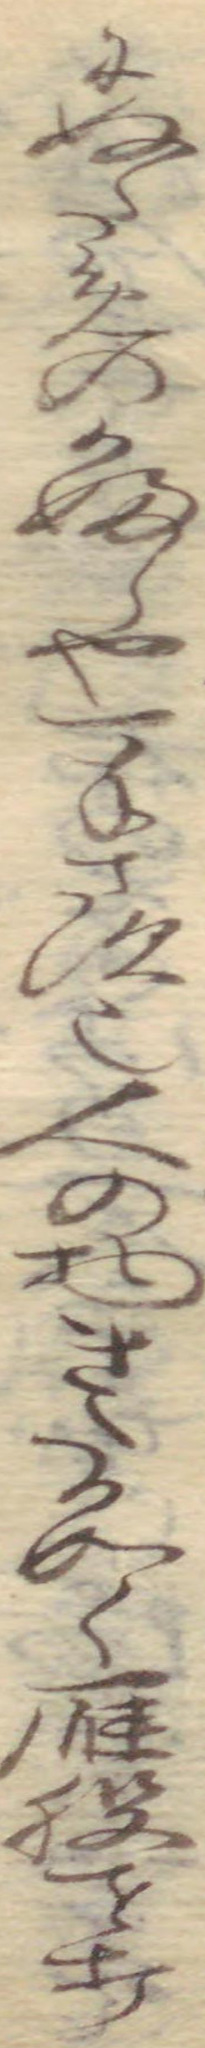にぬためのかふらや一手さす也人の物きたる如く雁股を打
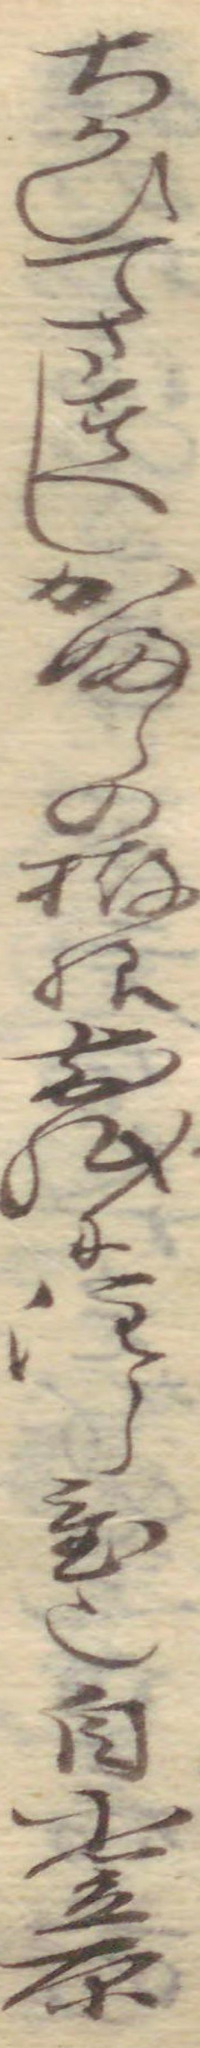ちかひてさすへしかふらの拵様前紙に注し置也自小笠原
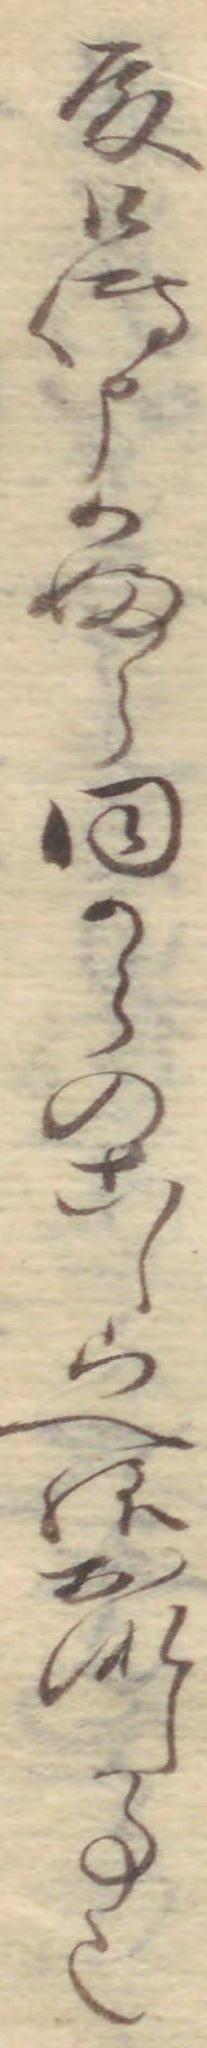殿口伝申かふら同からのこしらへ様おなし事也
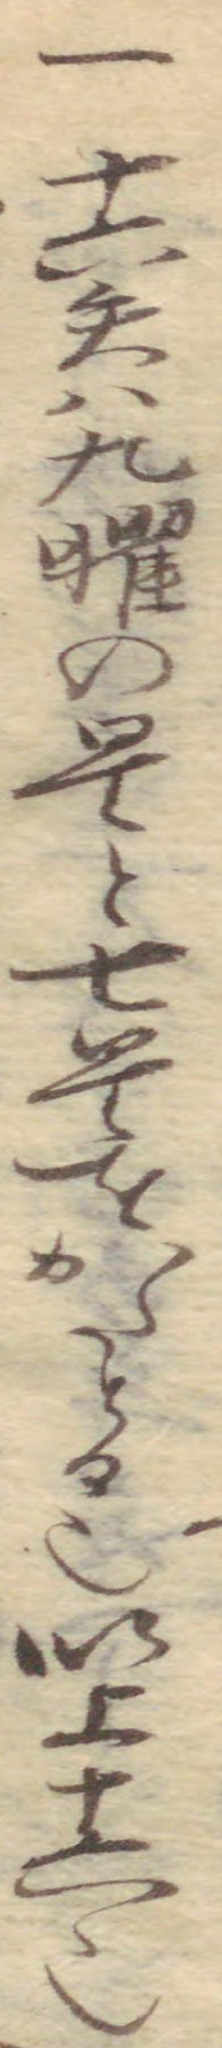一十六矢ハ九曜の星と七星をかたとる也以上十六也
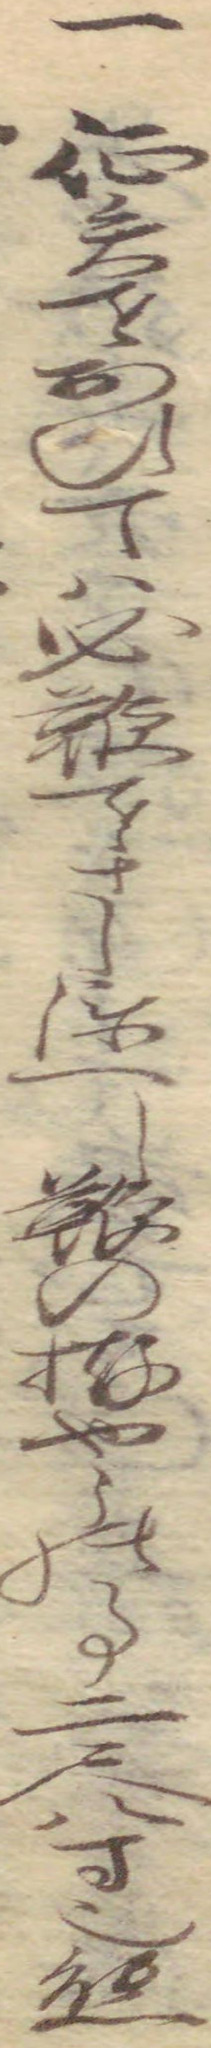一征矢をおひてハ必鞭をさし添へし鞭の拵やうの事二尺八寸也熊
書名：鶯宿雑記. 巻199-200
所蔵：国立国会図書館 National Diet Library, JAPAN
